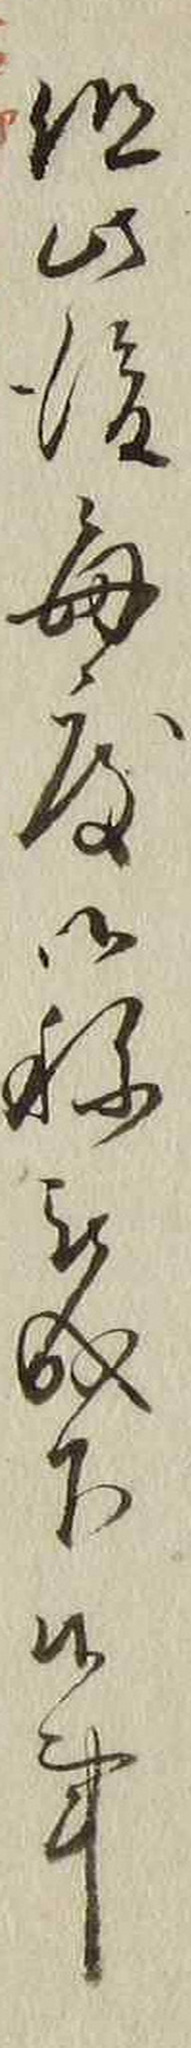但此後毎度御賞美被成下候事
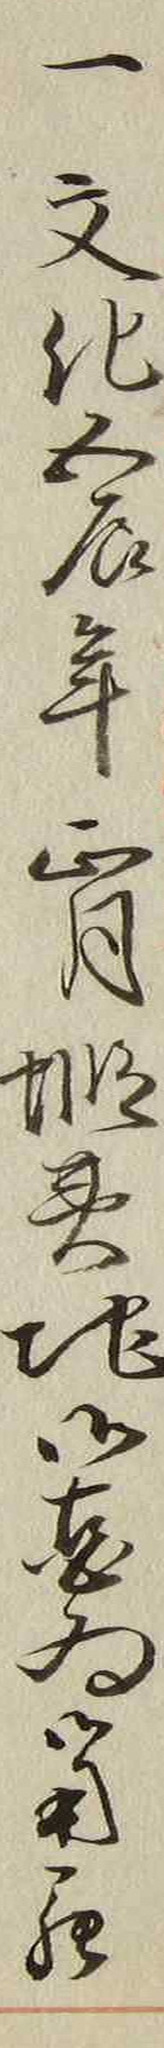一文化五辰年正月蝦夷地御固為御用罷
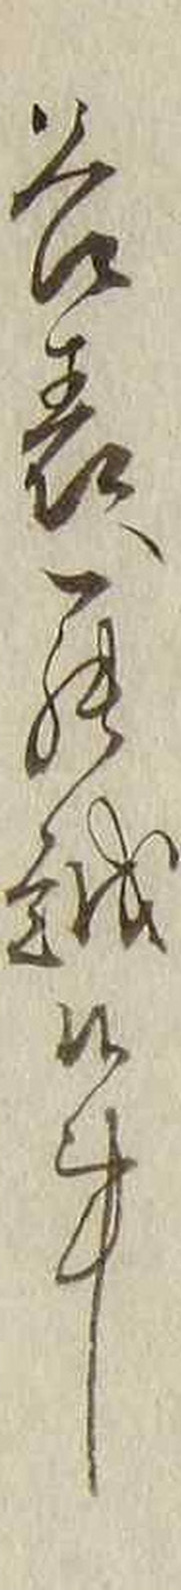谷表へ罷越候事
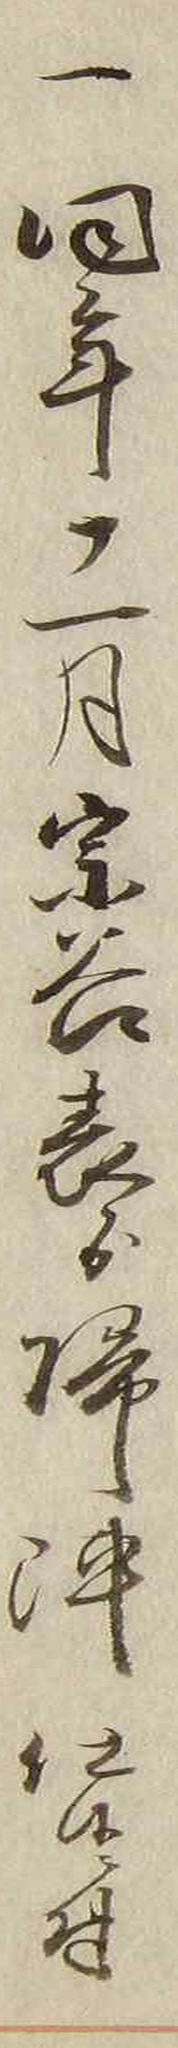一同年十一月宗谷表ゟ帰陣仕候ニ付

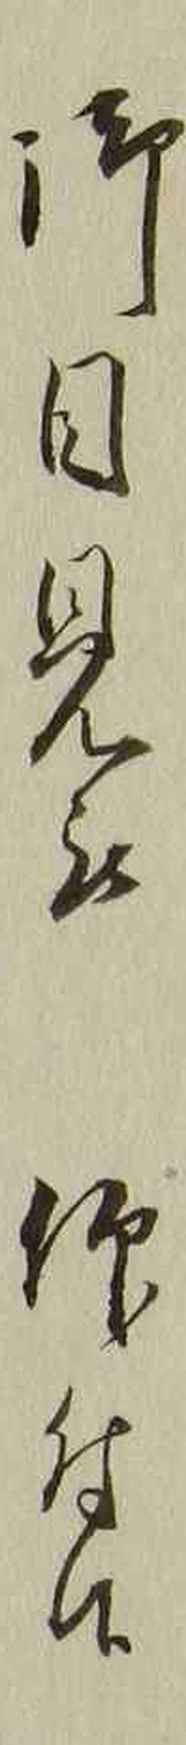御目見被仰付候
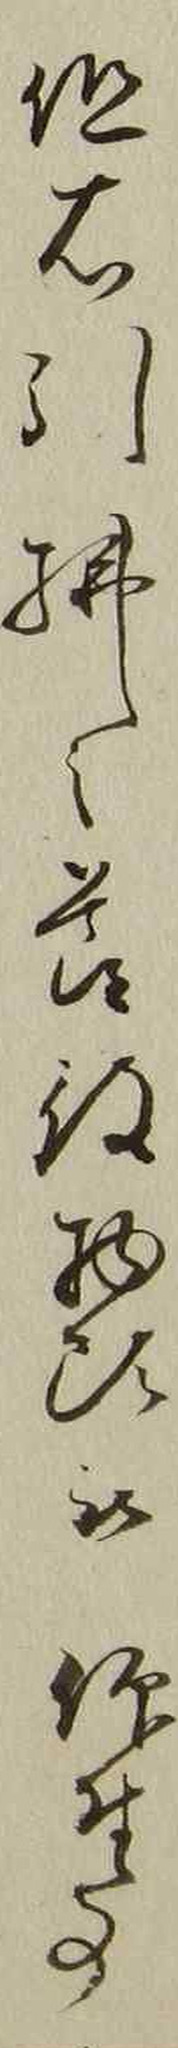但右引払之節役物頭被仰付候事
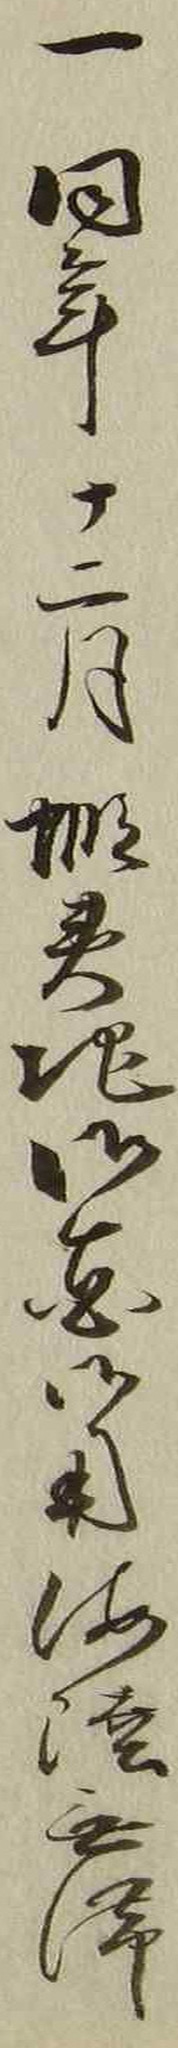一同年十二月蝦夷地御固御用海陸無滞
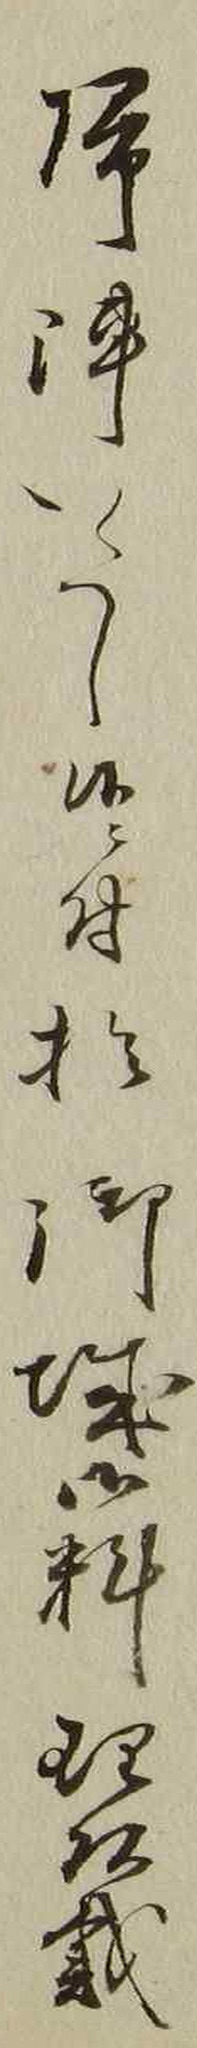帰陣いたし候ニ付於御城御料理頂戴
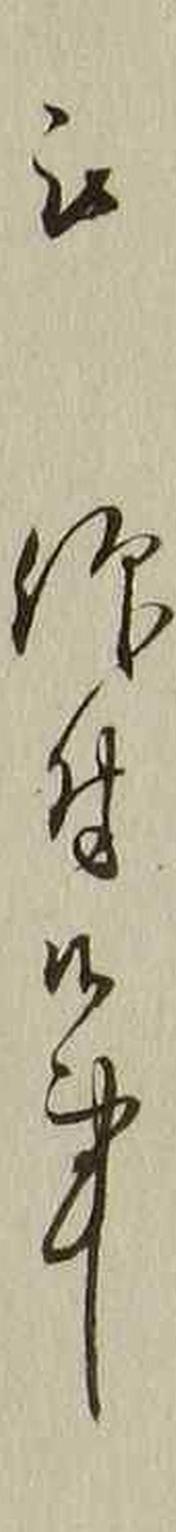被仰付候事
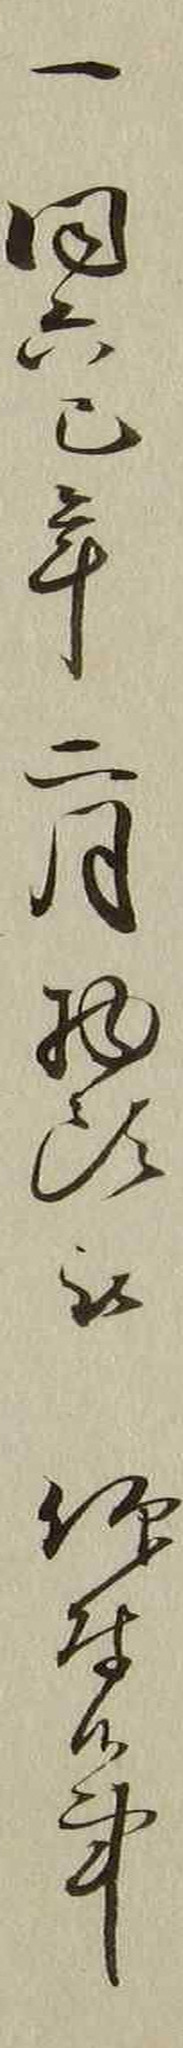一同六巳年二月物頭被仰付候事
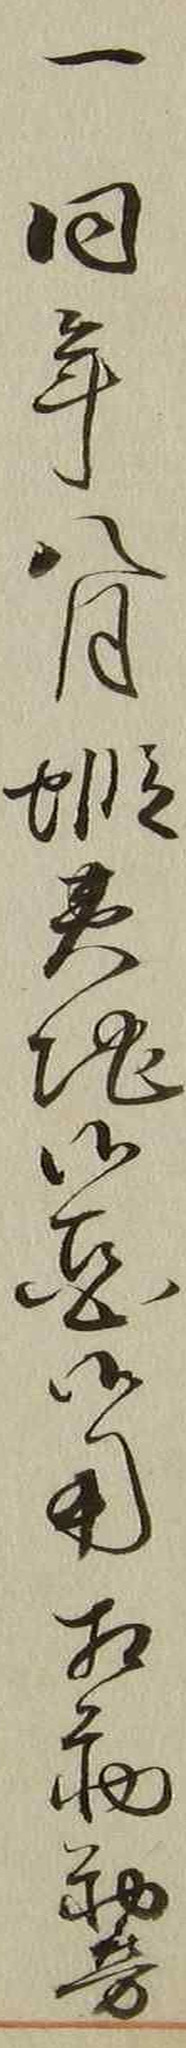一同年八月蝦夷地御固御用相勤勤労
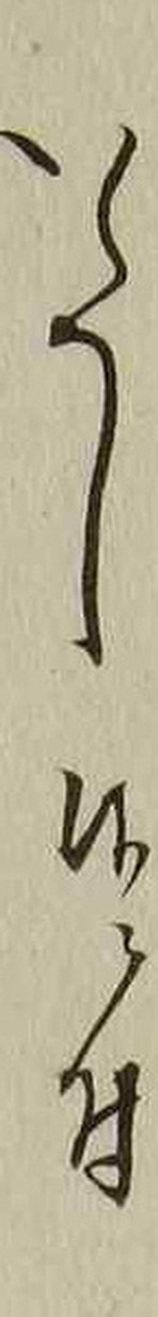いたし候ニ付
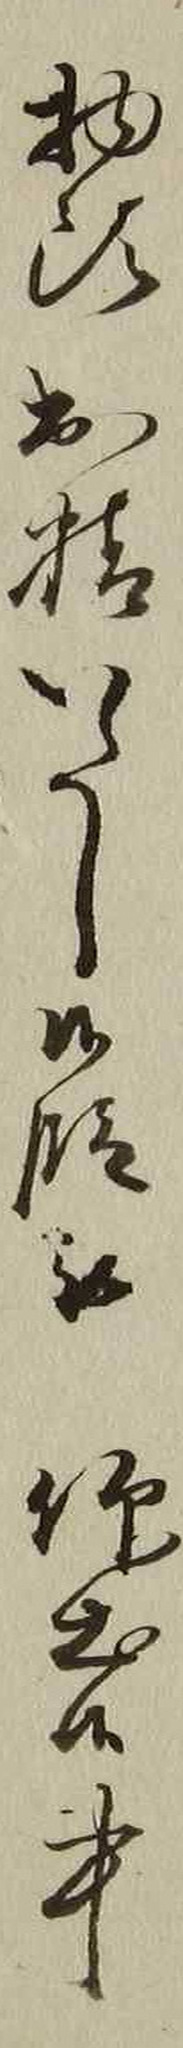物頭出精いたし候段被仰出候事
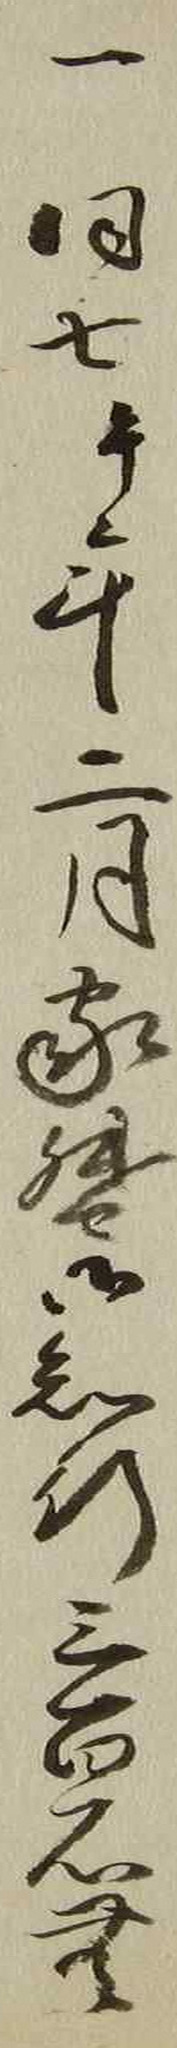一同七午二月家督御知行三百石無
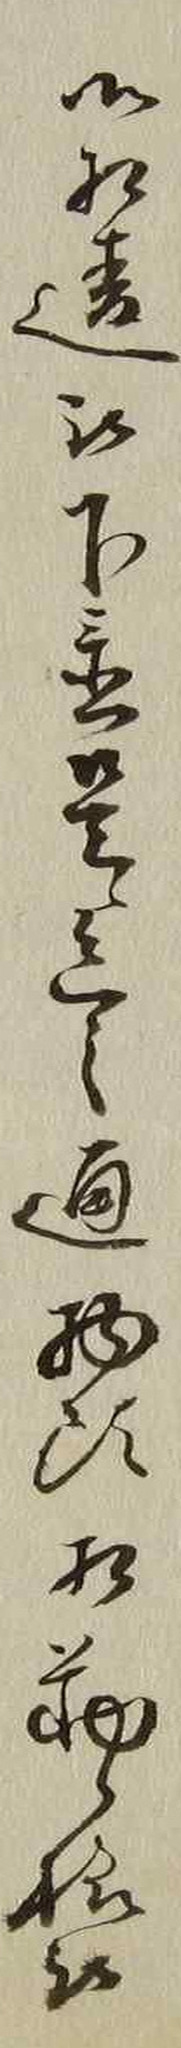御相違被下置是迄之通物頭相勤候様被
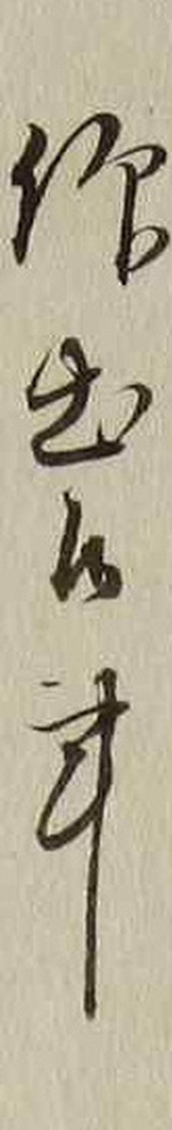仰出候事
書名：諸士系譜　巻之122　よ之部5
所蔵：会津若松市立会津図書館
